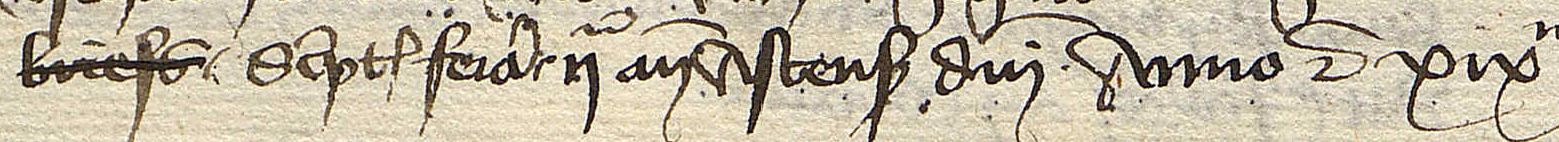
briefs / Sc*pt* feia* ii* an* Aſcenſ* dm* Anno ec* xix*
